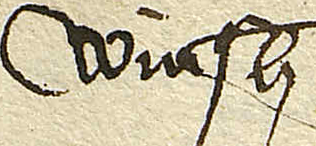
Winſh*
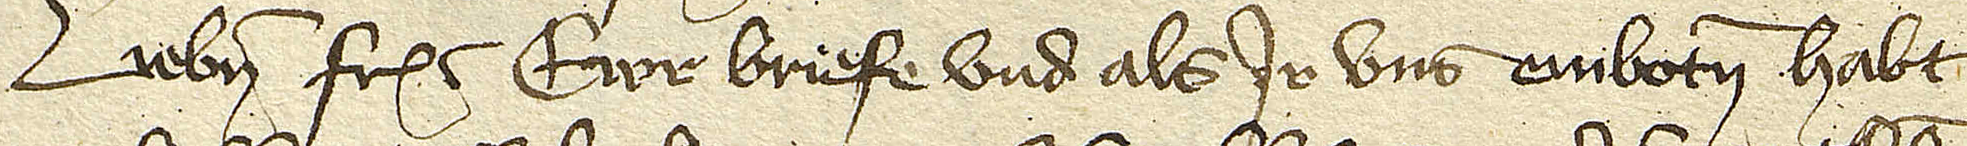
Liebn* fr* / Ewr briefe vnd als Ir vns embotn* habt
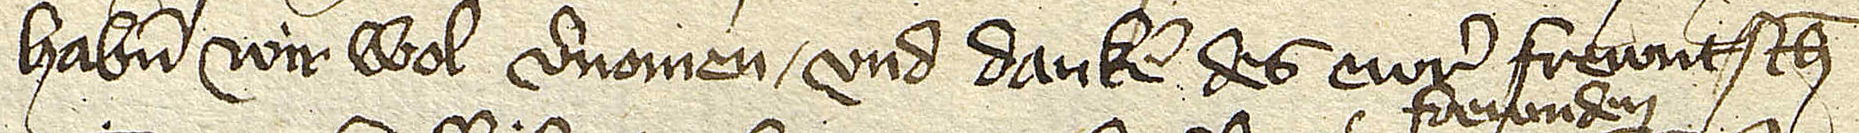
habn* wir wol v*nomen / vnd danke* des ewr* frewntſch*
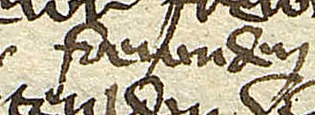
frewnden
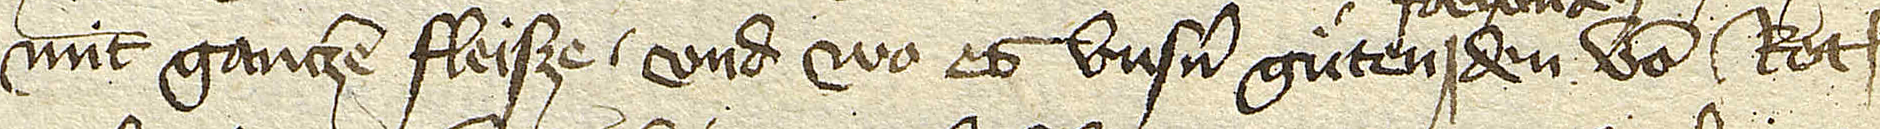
mit gancʒe* fleiſʒe / vnd wo es vnſn* güten den vo* Rot*
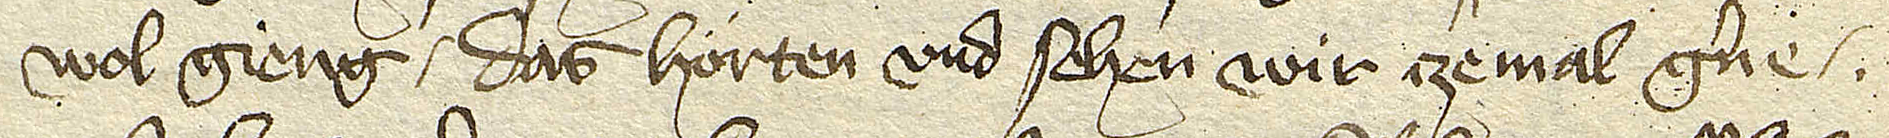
wol gieng / Das hörten vnd ſehen wir cʒemal g*ne / .
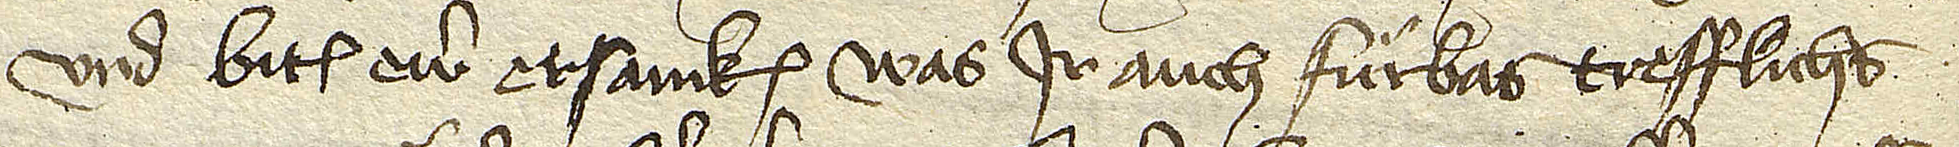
vnd bit* ew* erſamk* was Ir auch fürbas trefflichs
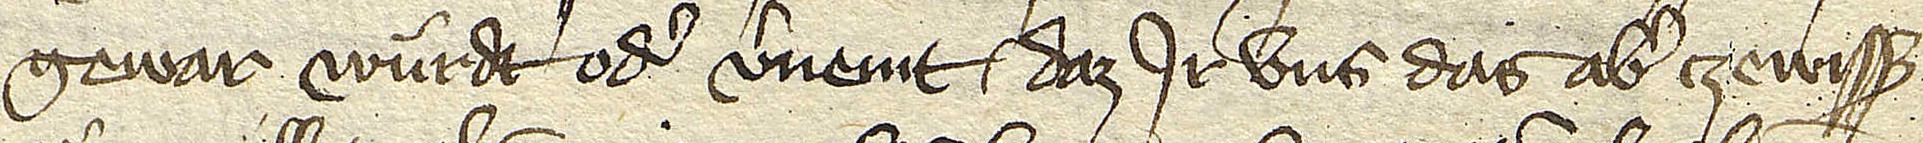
gewar würdt od* v*nemt / daʒ Ir vns das ab* cʒewiſſ*
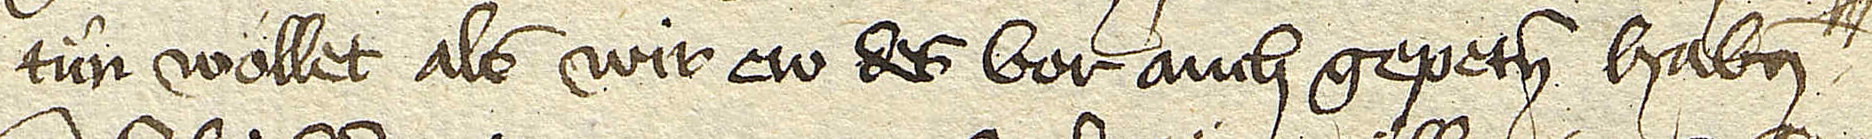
tün wöllet als wir ew des vor auch gepetn* habn*
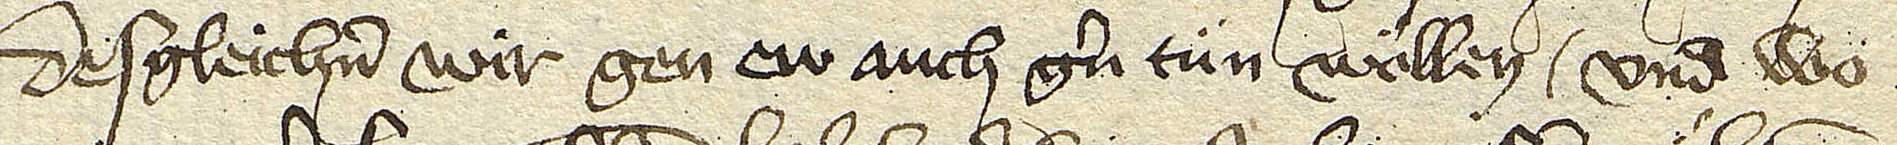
Deſgleichn* wir gen ew auch g*n tün wöllen / vnd wo
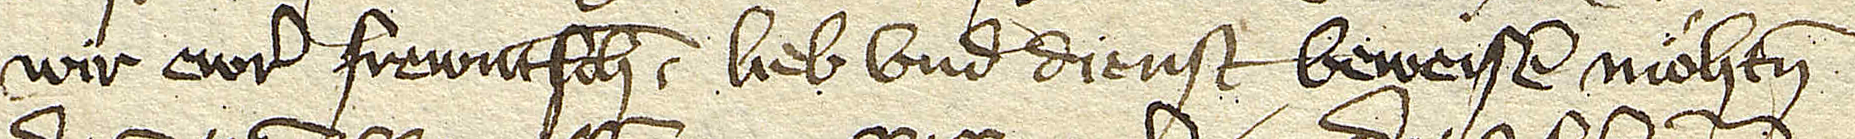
wir ewr* frewntſch* / lieb vnd dienſt beweiſe* möhtn*
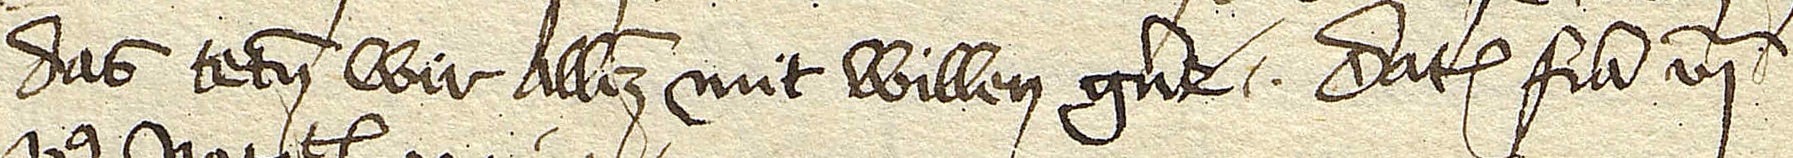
das tetn* wir allcʒ* mit willen gn*e / . Dat* fia* vi*
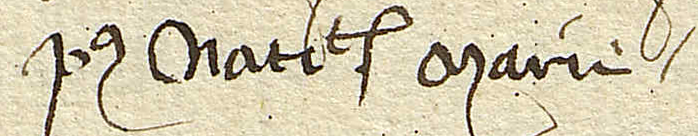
p* Nati* Maria /
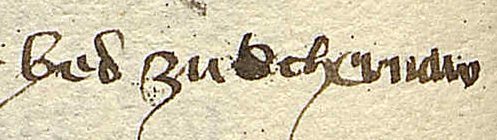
bed cʒu Schernaw
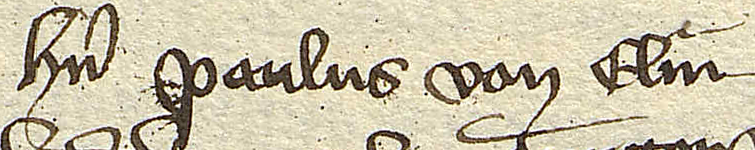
hn* paulus von Elm
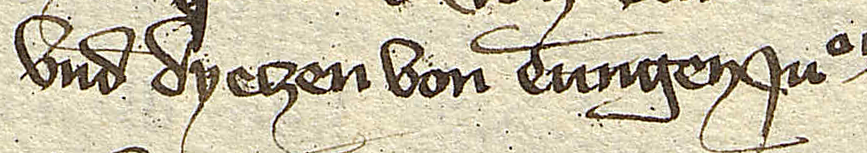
vnd dyecʒen von Tungen Iu*
